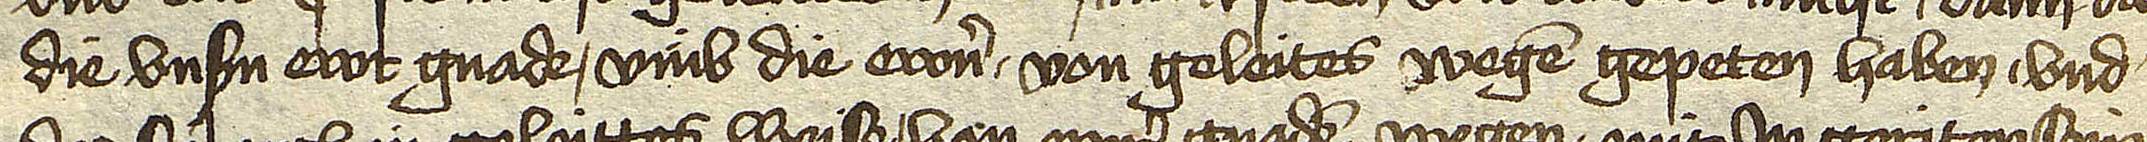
die vnſ*n ewr gnade / v̈mb die ewn* / von geleites wege* gepeten haben / vnd
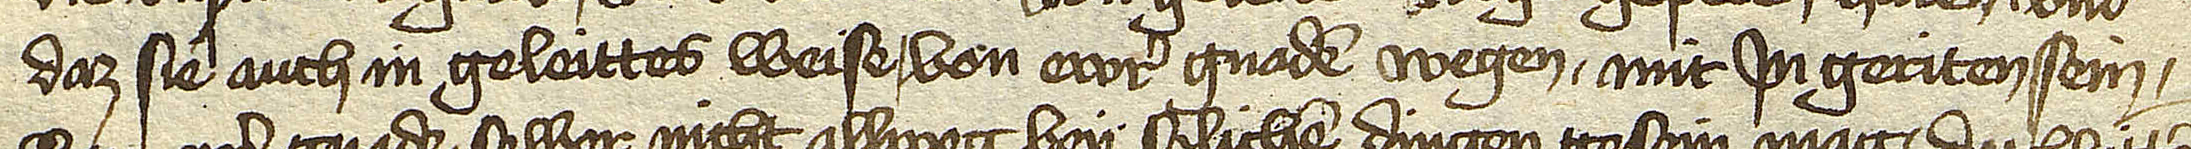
daʒ ſie auch in geleittes weiſe / von ewr* gnade* wegen / mit In gereiten ſein /
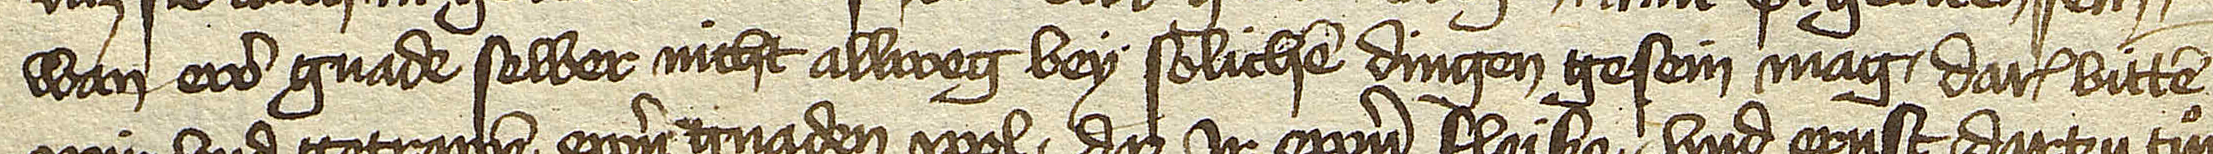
wan ew* gnade ſelber nicht allweg bey ſoliche* dingen geſein mag / dar* bitte*
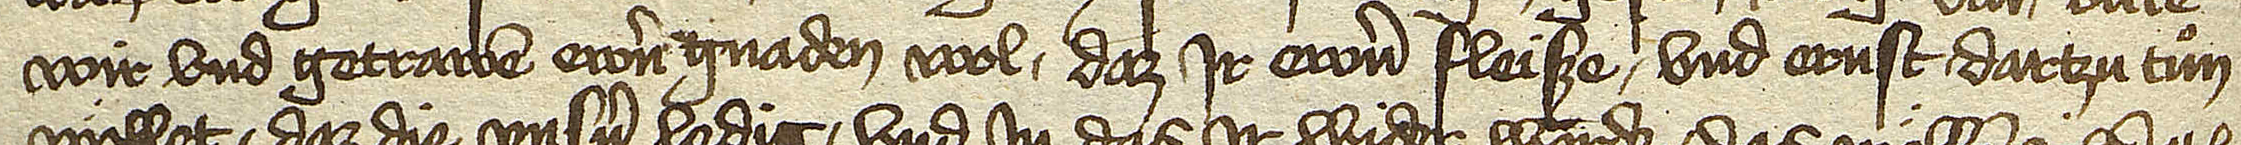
wir vnd getrawe* ewn* gnaden wol / daʒ Ir ewn* fleiſʒe / vnd ernſt / dartʒu tün
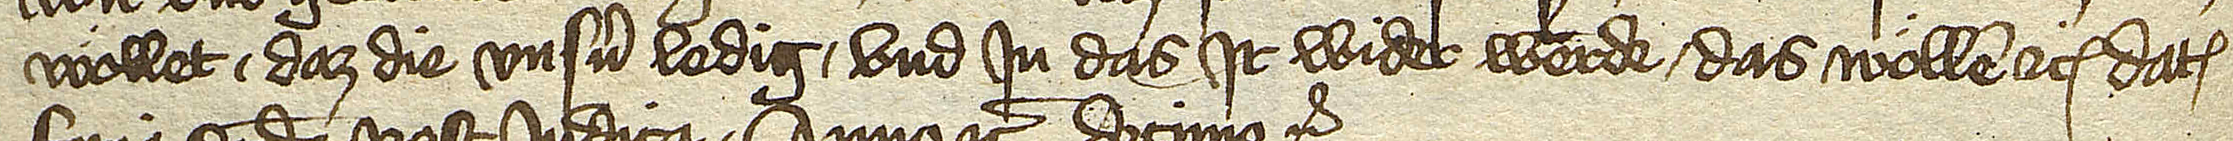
wöllet / daʒ die vnſn* ledig / vnd In das Ir wider werde / das wölle* ec* dat*
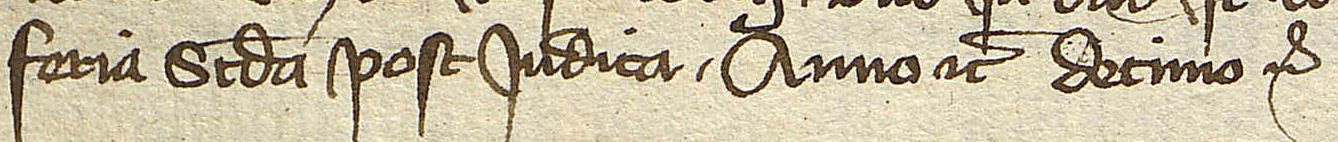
feria Scda* poſt Iudica / Anno ec* decimo §
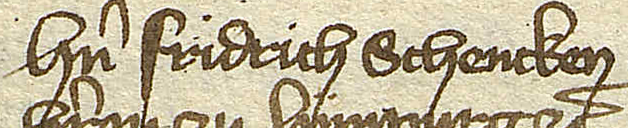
hn* Fridrich Schencken
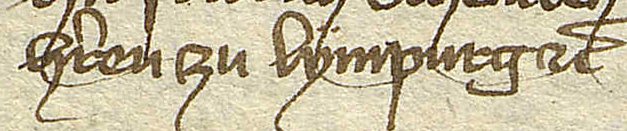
h*ren cʒu lympurg ec*
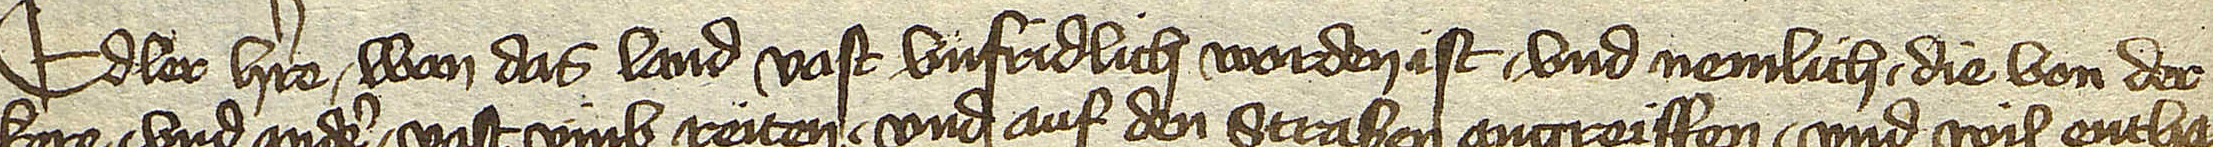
Edler hr*e / wan das land vaſt vnfridlich worden iſt / vnd nemlich / die von der
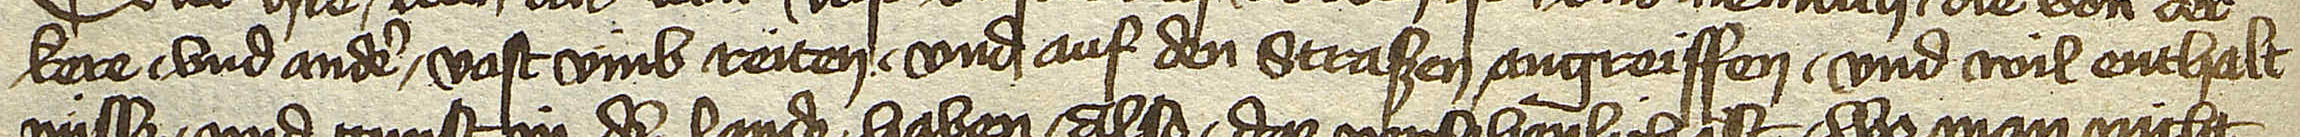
kere / vnd ande* / vaſt v̈mb reiten / vnd auf den Straſʒen angreiffen / vnd wil enthalt
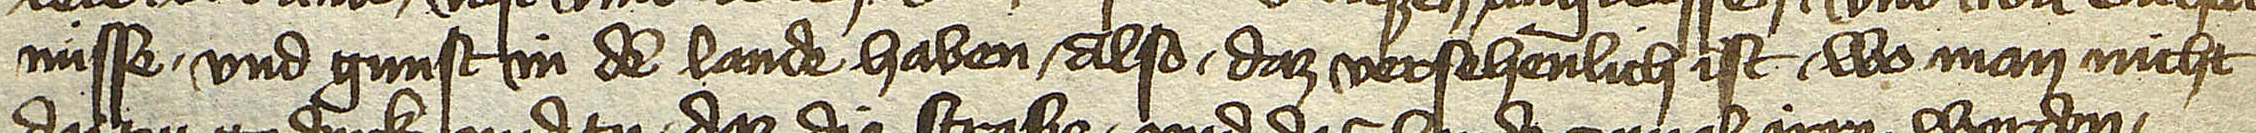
nüſſe / vnd gunſt in de* lande haben / Alſo / daʒ verſehenlich / wo man nicht
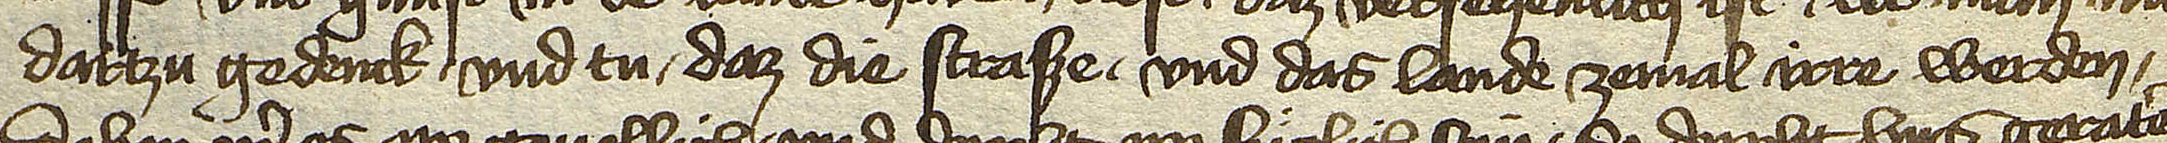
dartʒu gedenck / vnd tu / daʒ die ſtraſʒe / vnd das lande cʒemal irre werden /
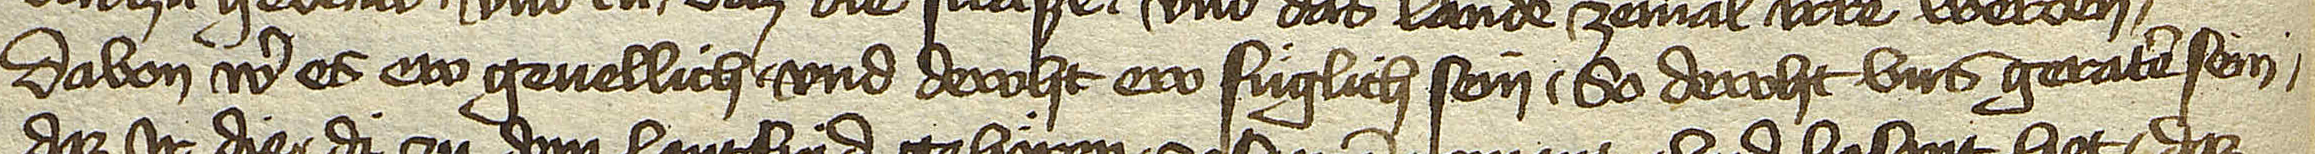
Davon w* es ew geuellich / vnd dewht ew füglich ſein / So dewht vns gerate* ſein /
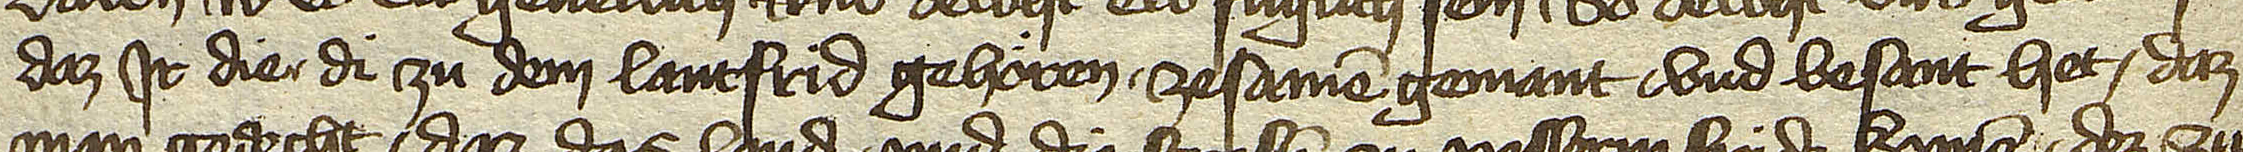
daʒ ir die / di cʒu dem lantfrid gehören / cʒeſame* gemant / vnd beſant het / daʒ
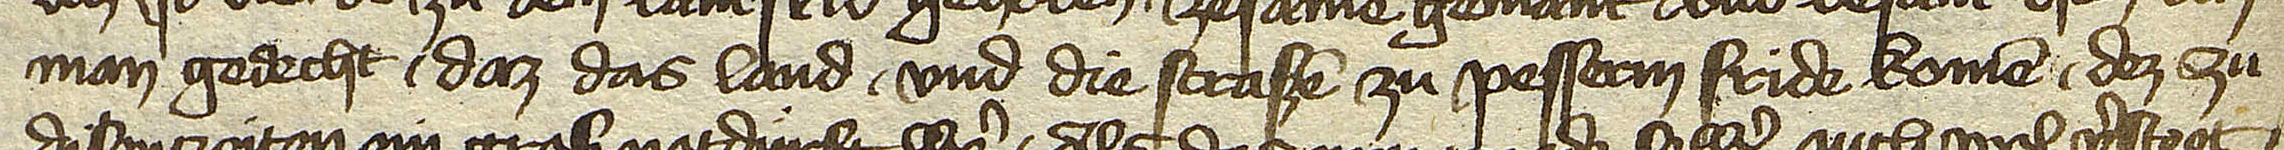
man gedecht / daʒ das land / vnd die ſtraſʒe* cʒu peſſerm fride kome* / deʒ cʒu
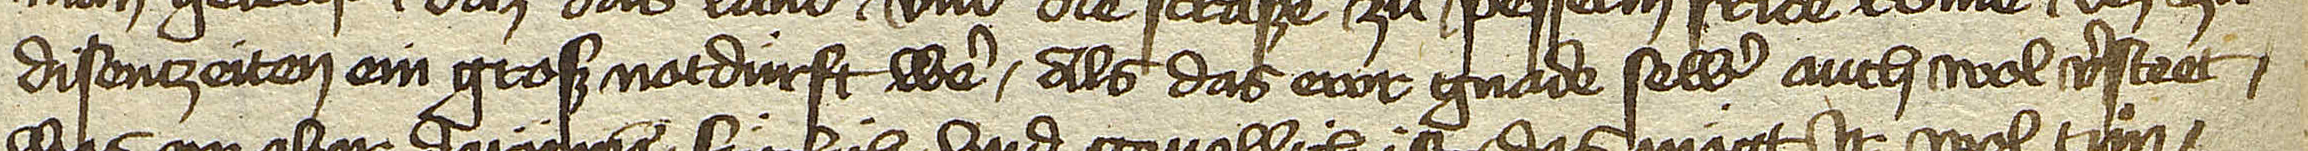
diſencʒeiten ein groſʒ notdürft we* / Als das ewr gnade ſelb* auch wol v*steet /
